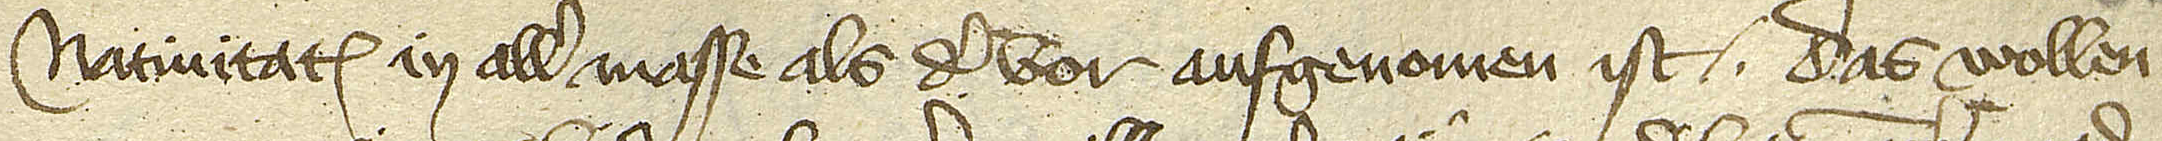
Natiuitat* in all* maſſe als d* vor aufgenomen iſt / . Das wollen
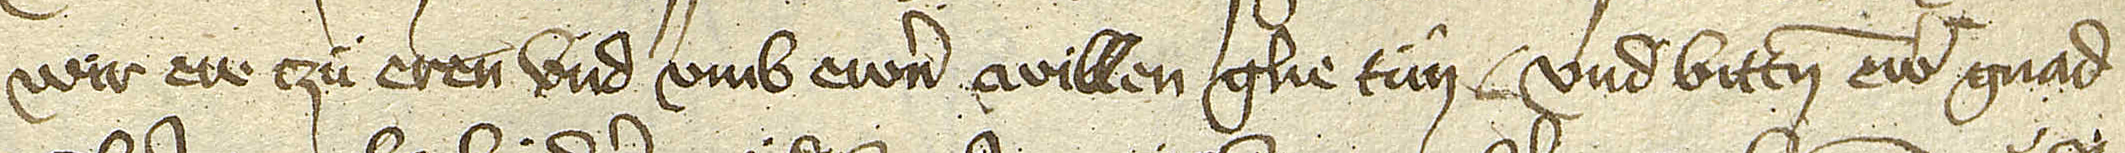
wir ew cʒü eren vnd vmb ewn* willen g*ne tün / vnd bittn* ew* gnad
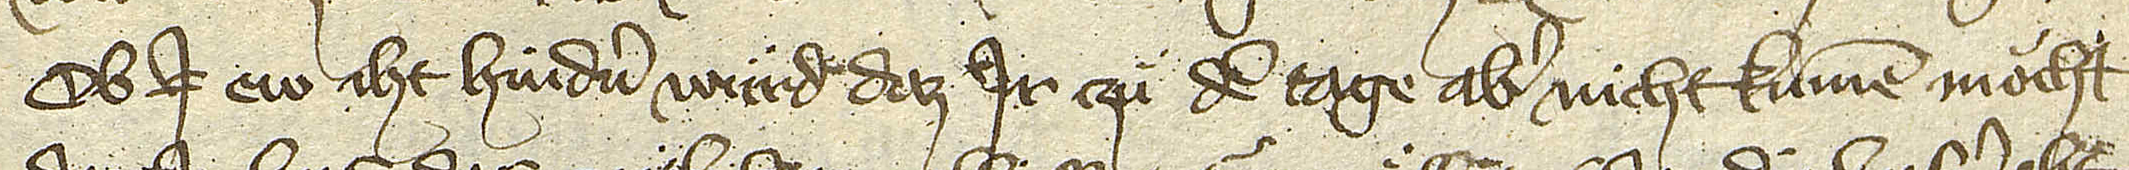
Ob I ew iht hindn* würd daʒ Ir cʒü d* tage ab* nicht kume* möcht
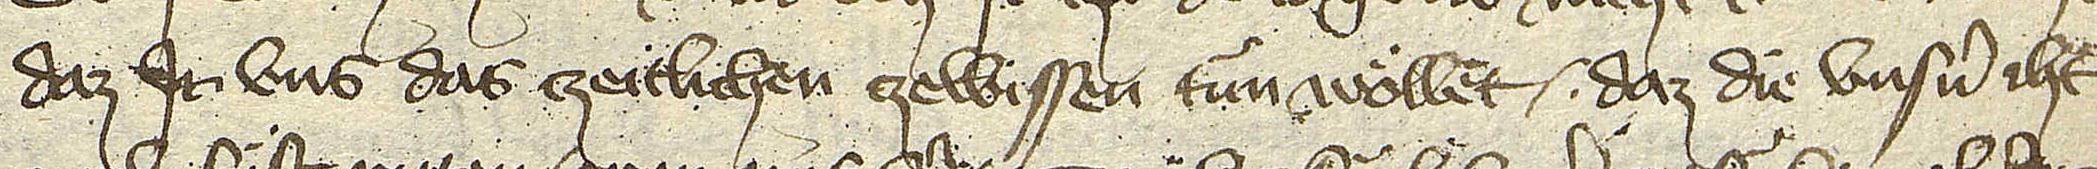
daʒ Ir vns das cʒeitlichen cʒewiſſen tün wöllet / daʒ die vnſn* iht
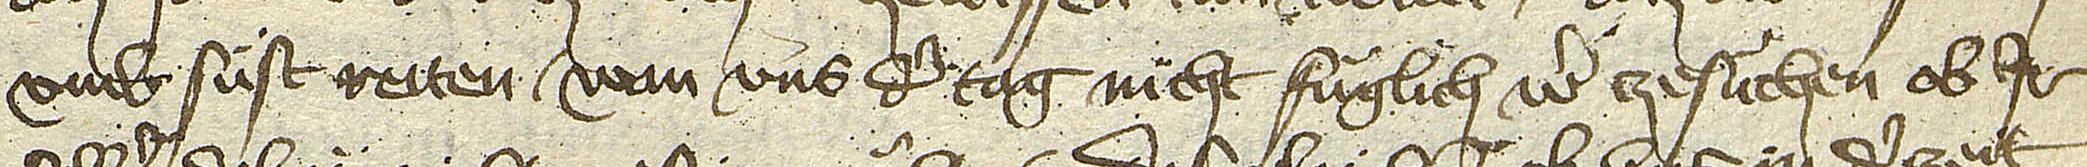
vmbſüſt reiten / wan vns d* tag nicht füglich w* cʒeſüchen ob Ir
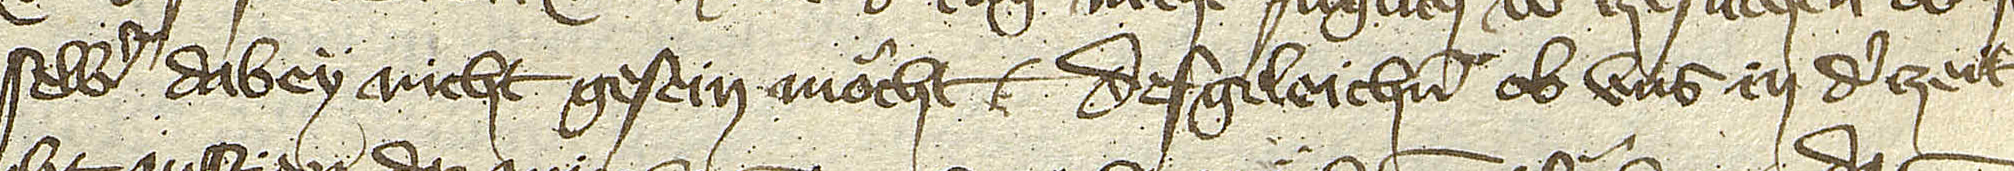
ſelb* dabey nicht geſein möcht / Desgeleichn* ob vns in d* cʒeit
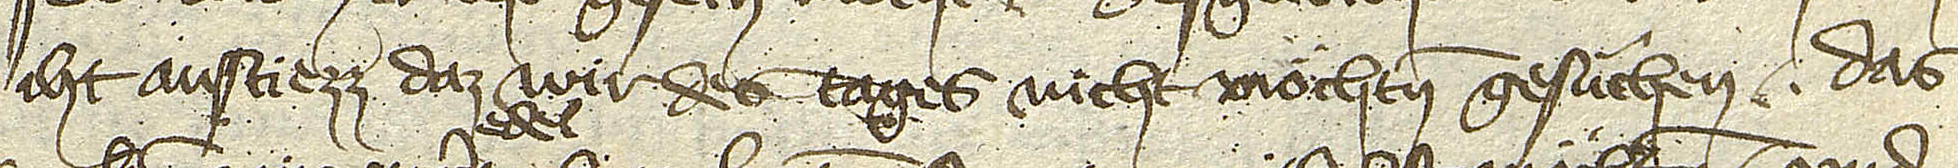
iht auſtieʒʒ daʒ wir des tages nicht möchtn* geſüchen / . das
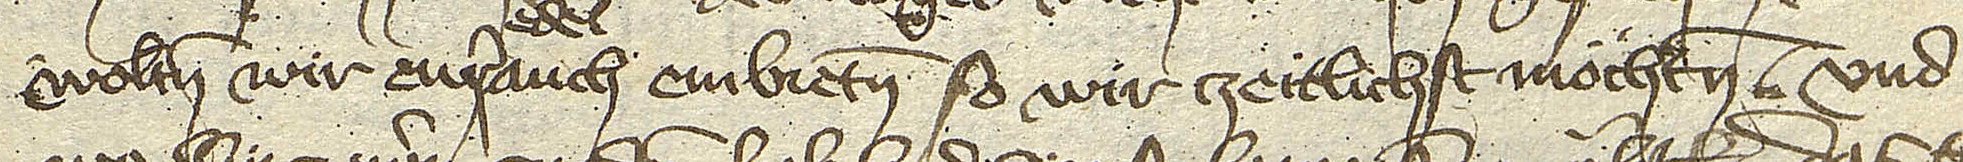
woltn* wir ewr* auch embietn* ſo wir cʒeitlichſt möchtn* / vnd
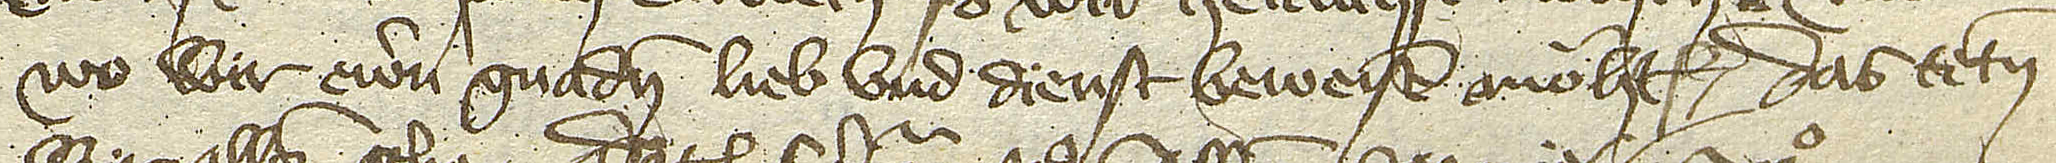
wo wir ewn* gnadn* lieb vnd dienſt beweiſe* möht* / das tetn*
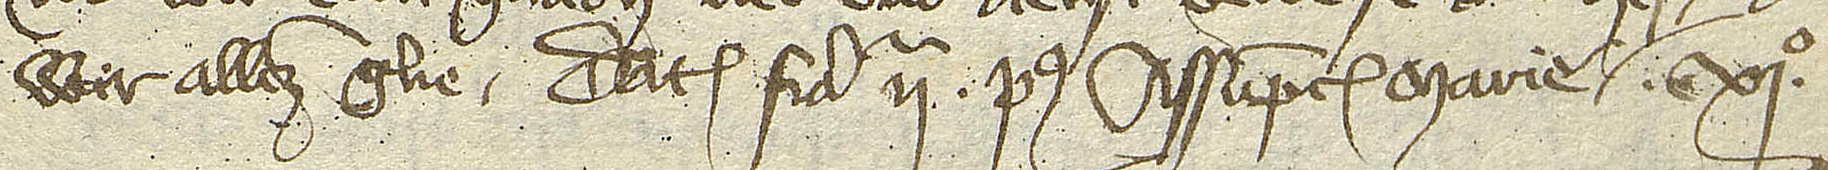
wir allcʒ* g*ne / Dat* fia* ii* . p* Aſſupc* Marie / . xi* .
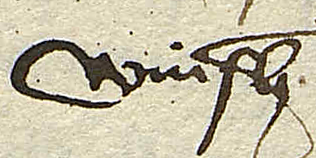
winſh*
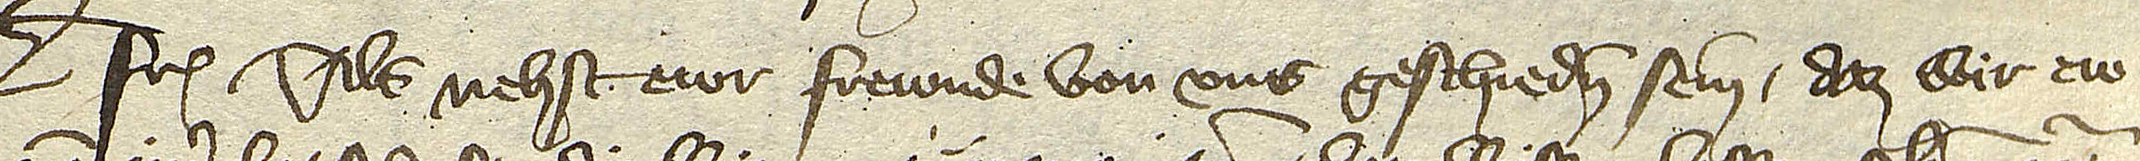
L* fr* / Als nehſt ewr frewnde von vns geſchiedn* ſein / daʒ wir ew
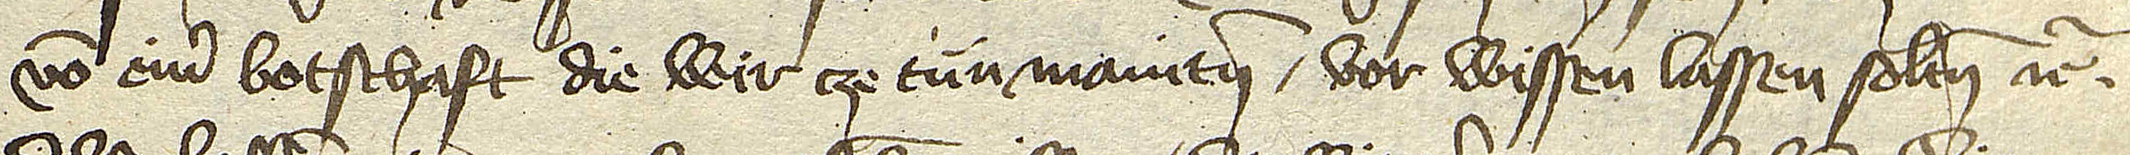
vo* ein* botſchaft die wir cʒe tün maintn* / vor wiſſen laſſen ſoltn* ec* .
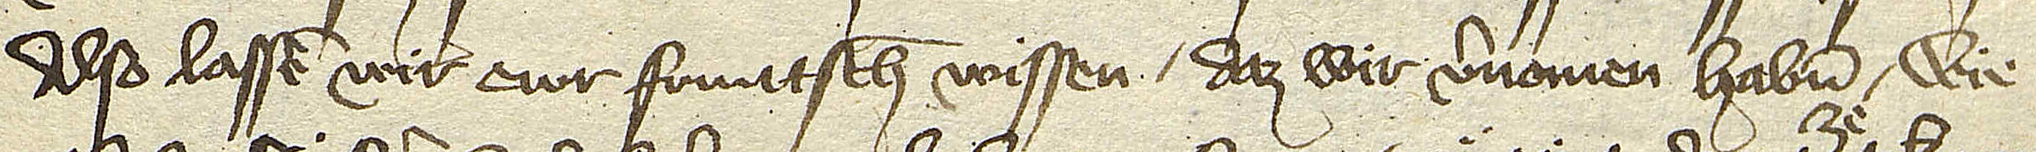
Alſo laſſe wir ewr fruntſch* wiſſen / daʒ wir v*nomen habn* / wie
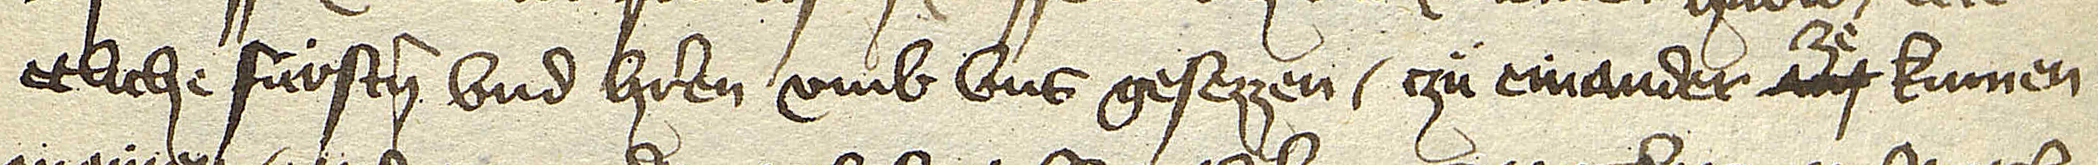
etliche fürſtn* vnd hr*en vmb vns geſeʒʒen / cʒü einander auf kumen
